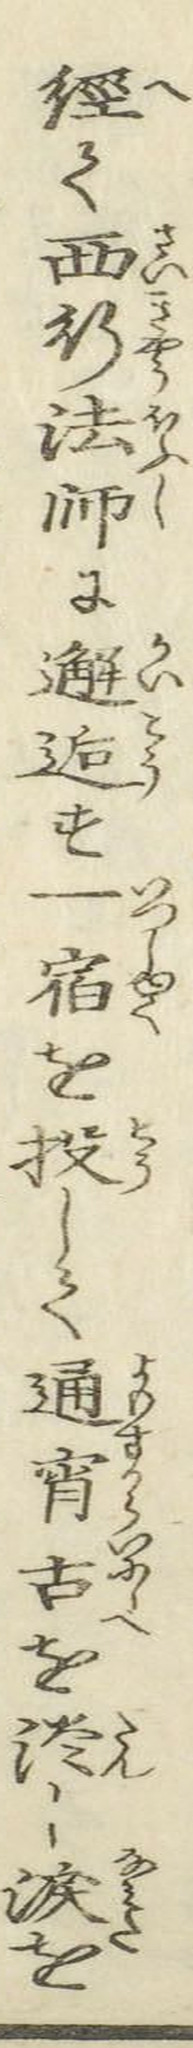経て西行法師に邂逅す一宿を投して通宵古を淡し涙を

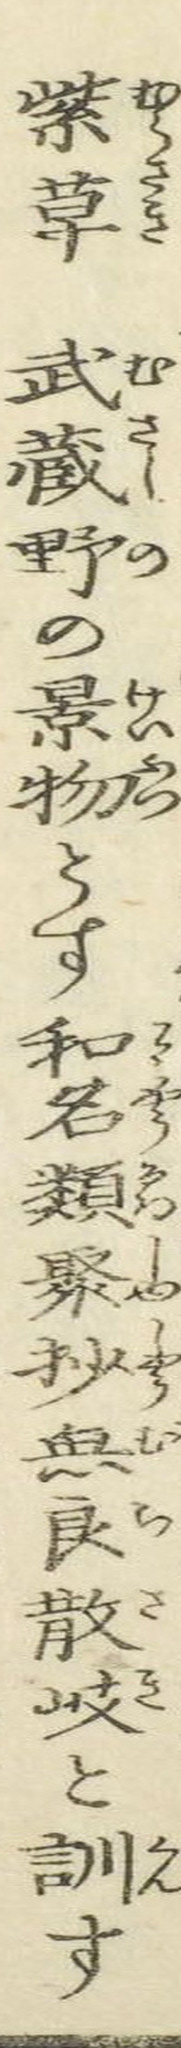紫草武蔵野の景物とす和名類聚抄無良散岐と訓す
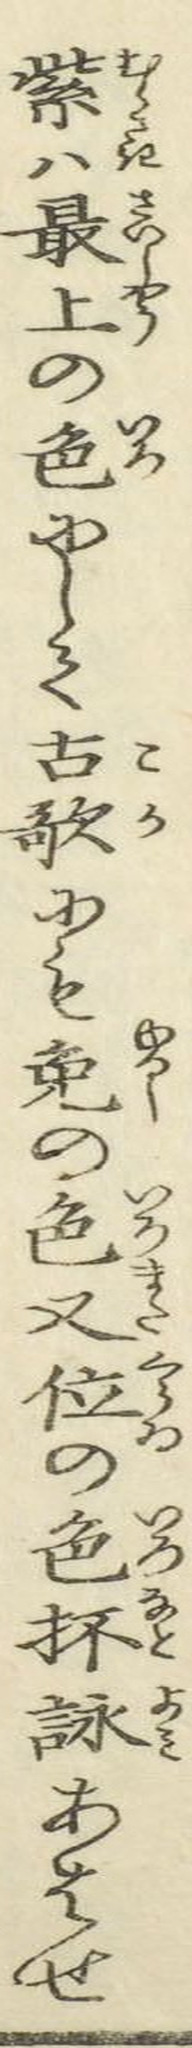紫は最上の色にして古歌にも免の色又位の色抔詠あはせ
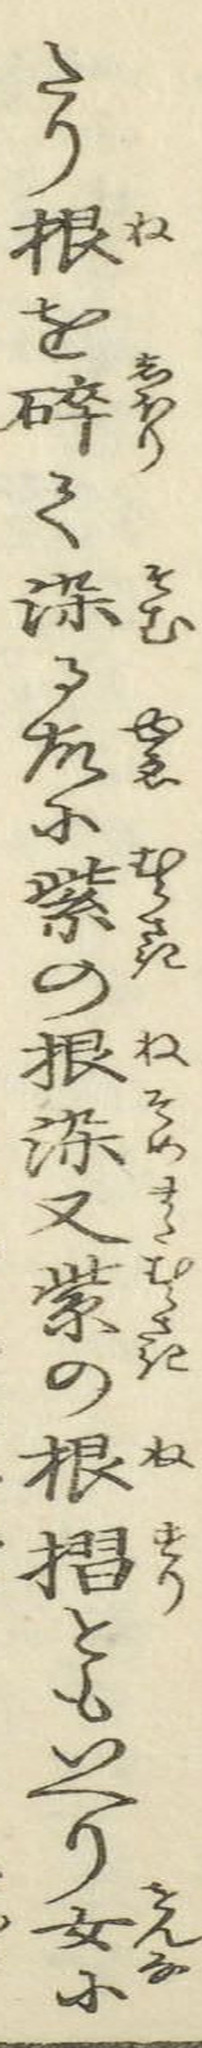たり根を砕て染る故に紫の根染又紫の根摺ともいへり女に
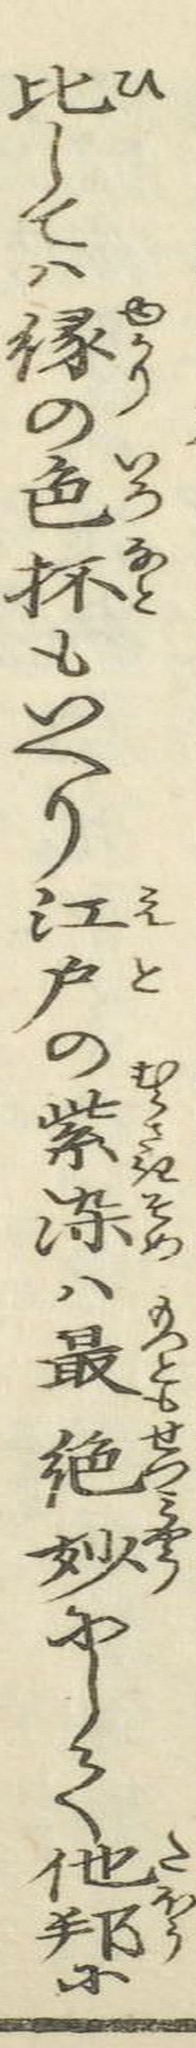比しては縁の色抔もいへり江戸の紫染は最絶妙にして他邦に
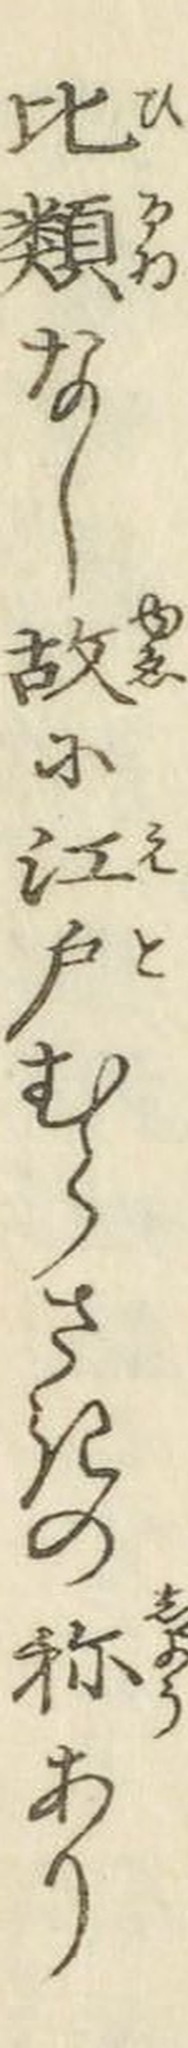比類なし故に江戸むらさきの称あり
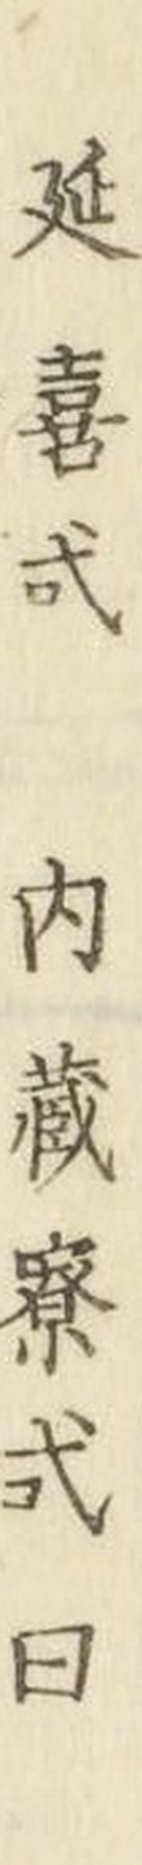延喜式内蔵寮式曰
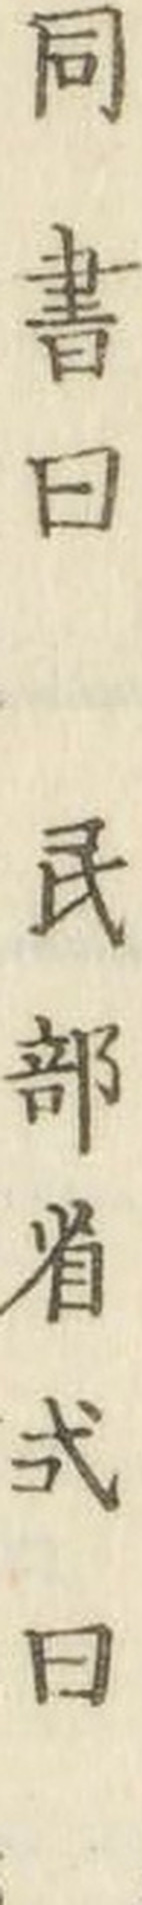同書曰民部省式曰
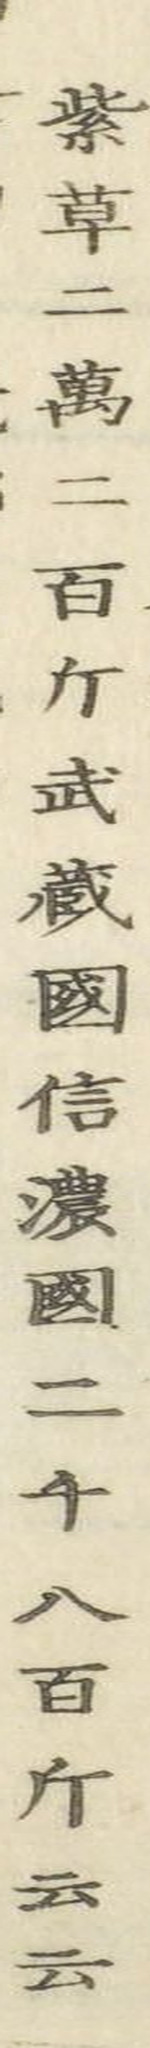紫草二萬二百斤武蔵国信濃国二千八百斤云々
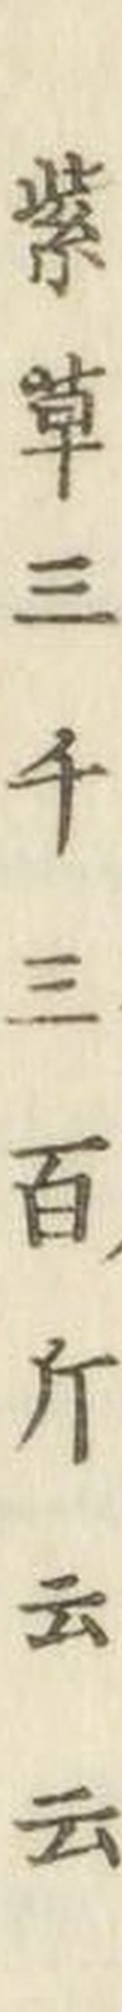紫草三千三百斤云々
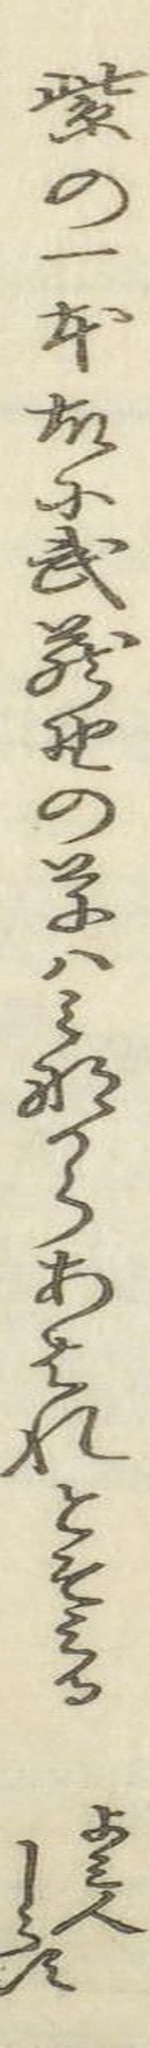古今紫の一本故に武蔵野の草はみなからあはれとそみるよみ人しらす
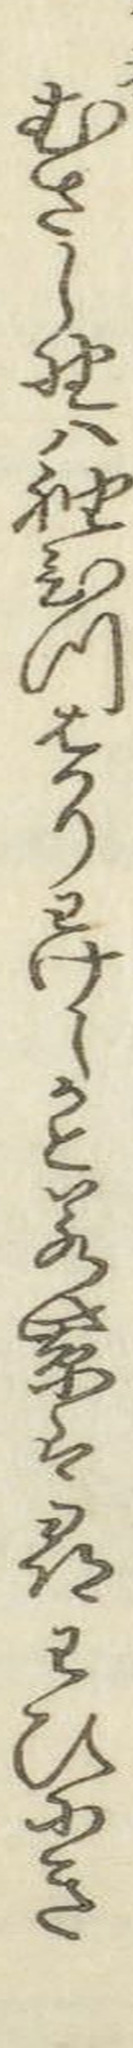後撰むさし野は袖ひつはかりわけしかと若紫は尋わひにき同
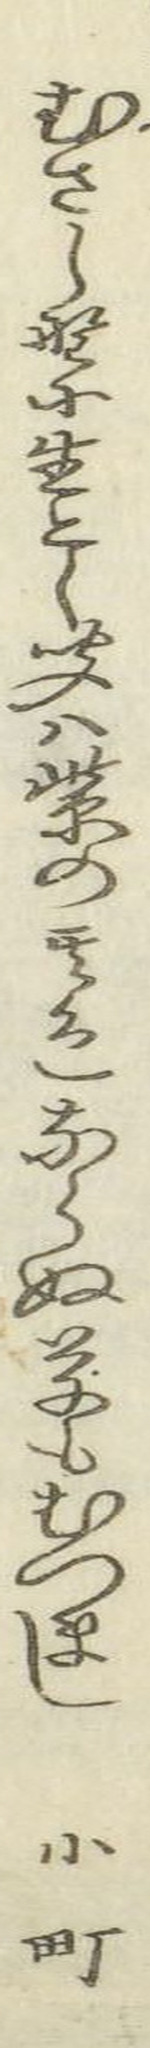続古今むさし野に生とし聞は紫の其色ならぬ草もむつまし小町
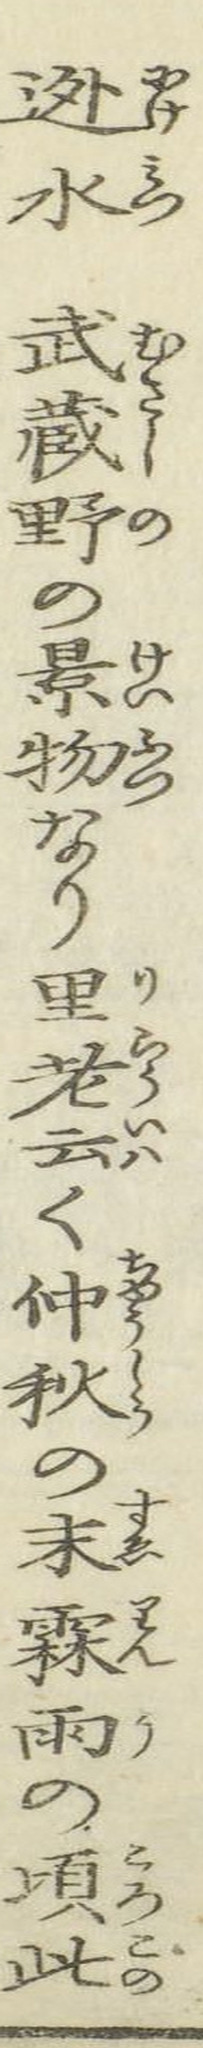逃水武蔵野の景物なり里老云く仲秋の末霖雨の頃此
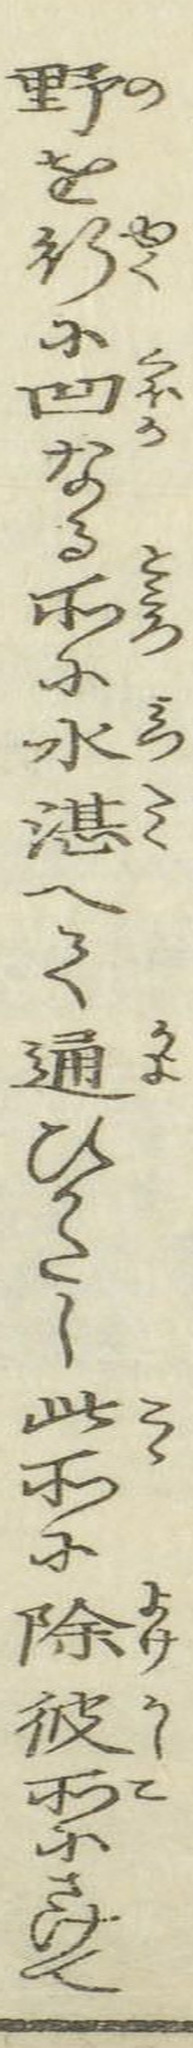野を行に凹なる所に水湛へて通ひかたし此所に除彼所にさけて
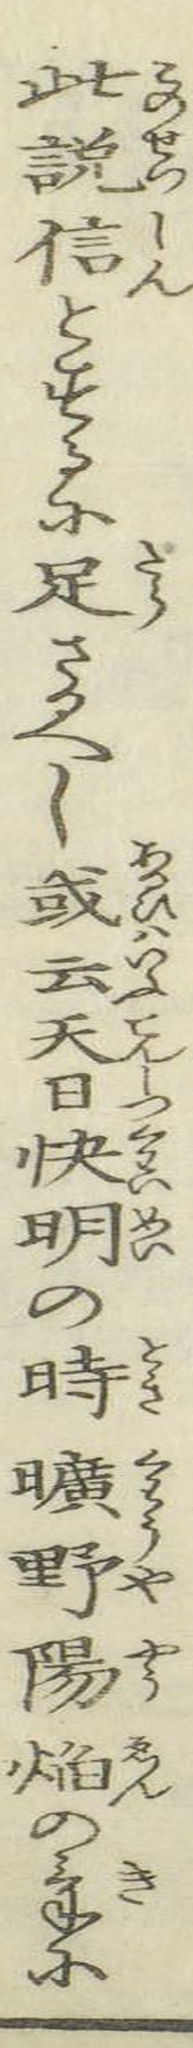此説信とするに足さるへし或云天日快明の時嚝野陽熖の気に
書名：江戸名所図会 20巻 巻之9
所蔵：東京学芸大学教育コンテンツアーカイブ
